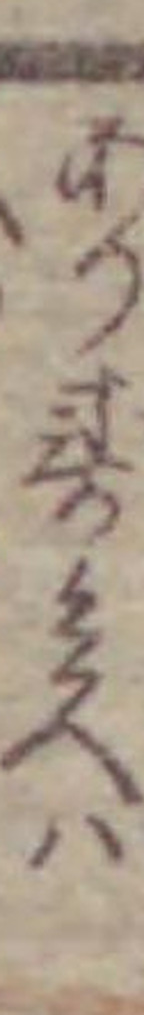あり寿兵へは
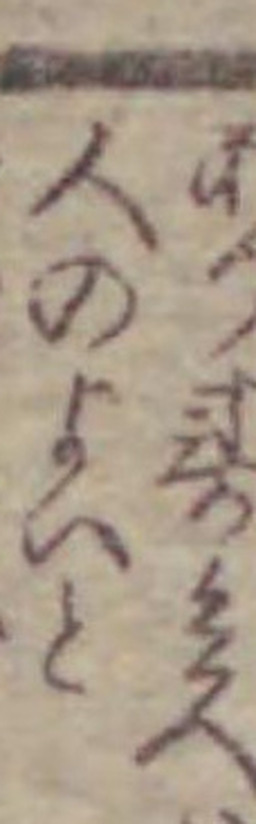人のよいと
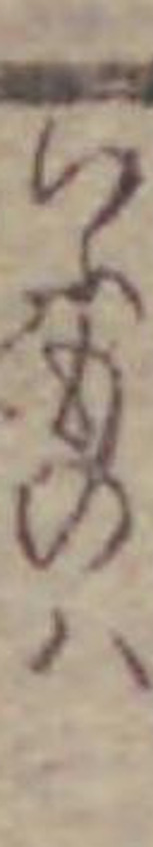いふものは
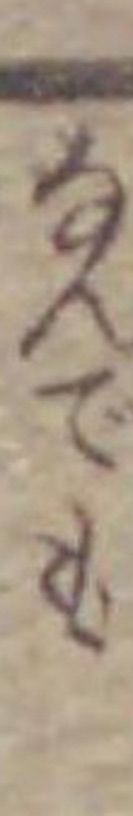なんでも
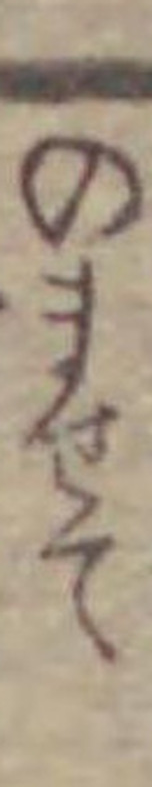のませて
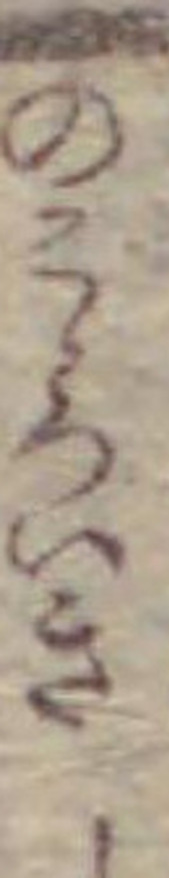のこゝろいき
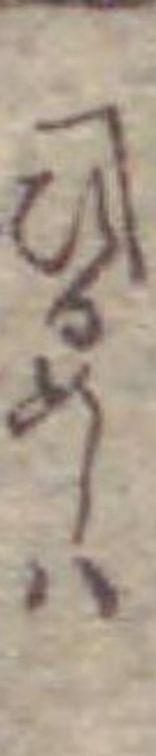〽ひるめしは
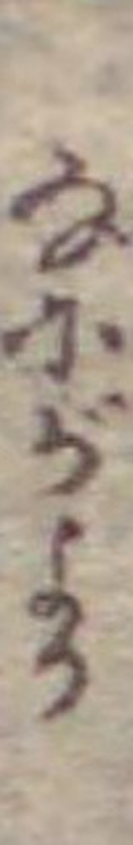なにがよか
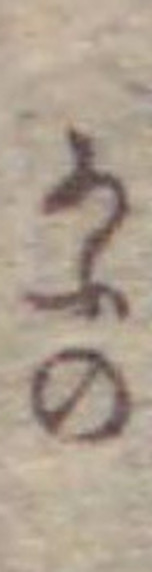ろふの

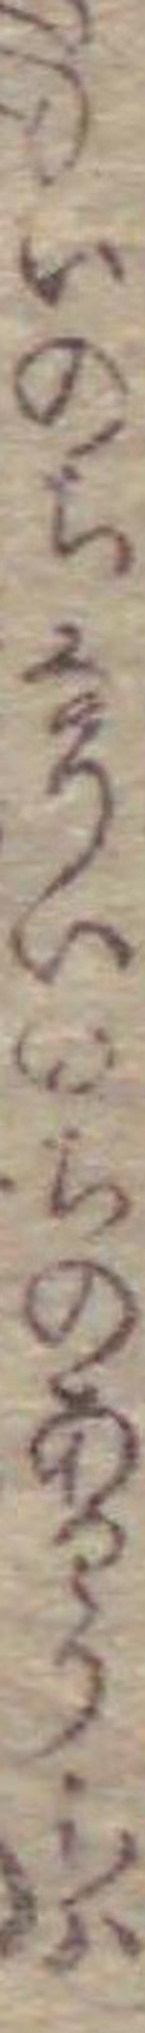いのちなりいのちのあるうちは
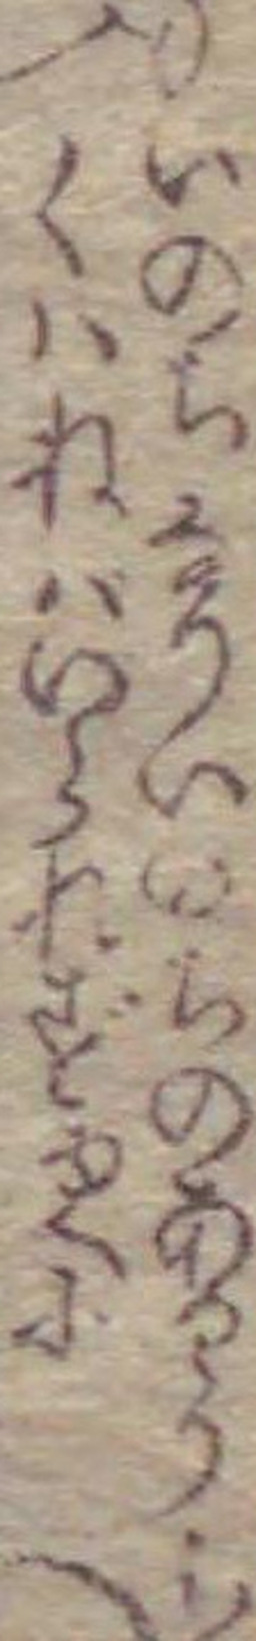くはねはいられずゆへに
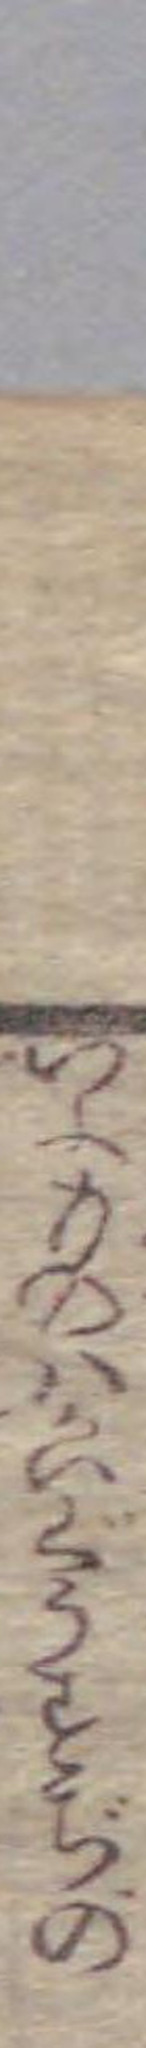いふものはかいどうすぢの
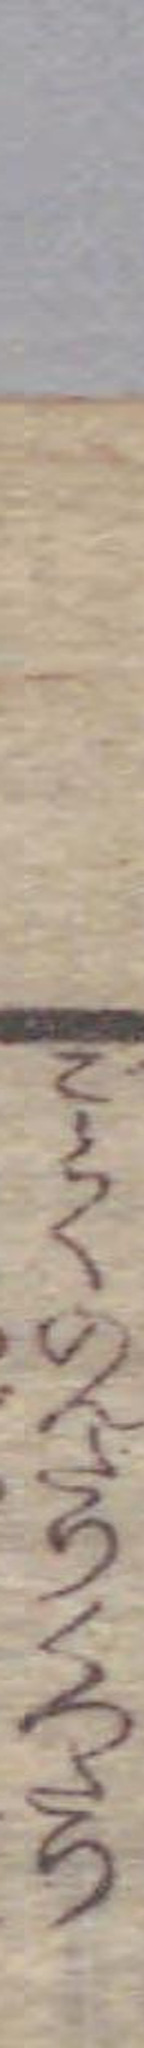ごとくのんだりくつたり
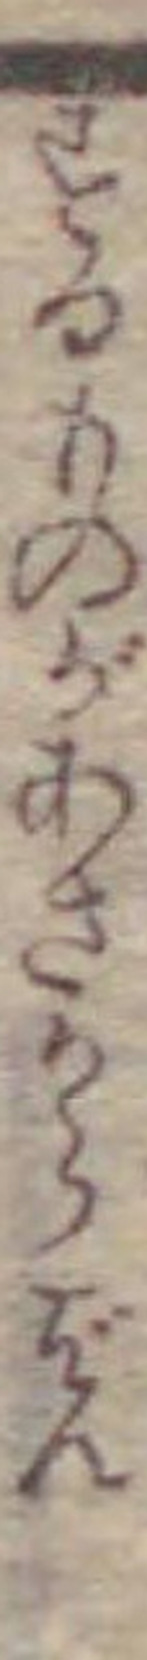するものがあさからばん
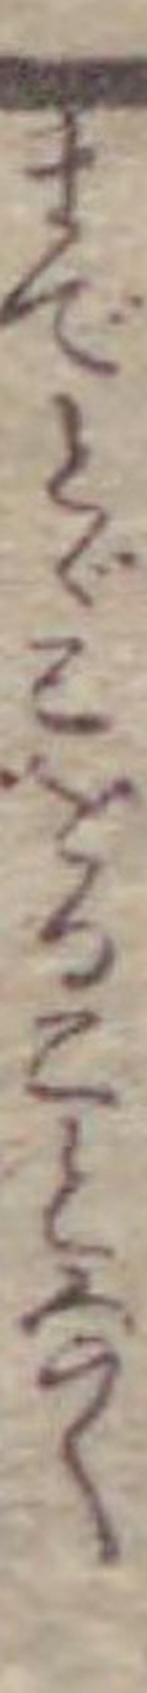までとゞこをることなく
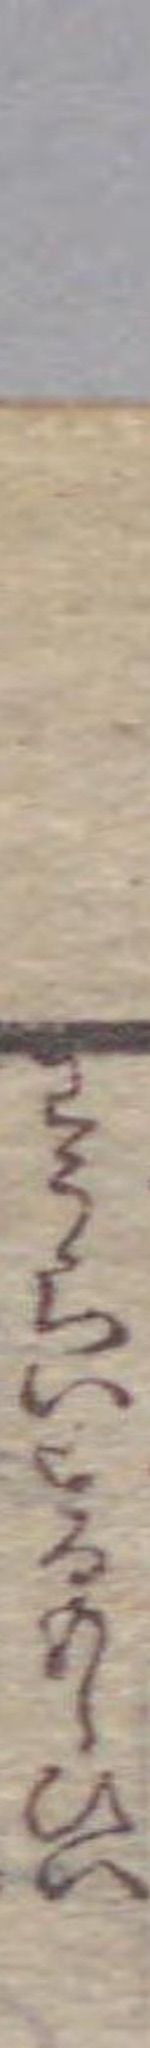わうらいするもしひい
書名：鼻下長生薬 : 3巻
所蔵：国立国会図書館 National Diet Library, JAPAN
